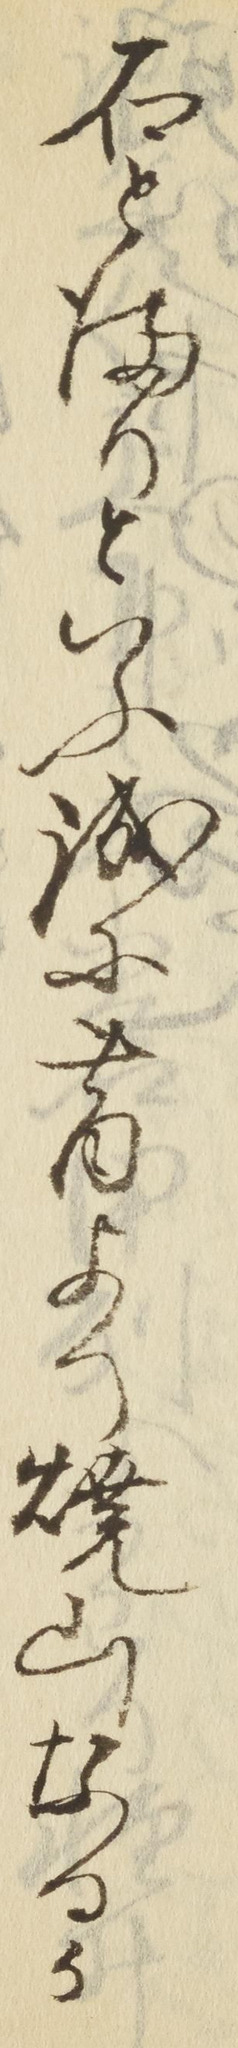石と満りといふ誠に昔より焼山なるか
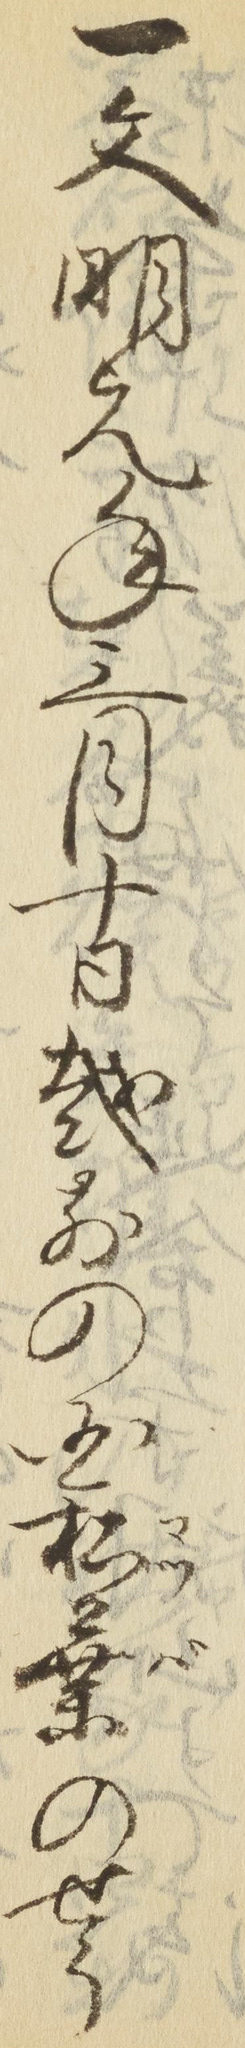一文明元年三月十日越前の国松葉のせう
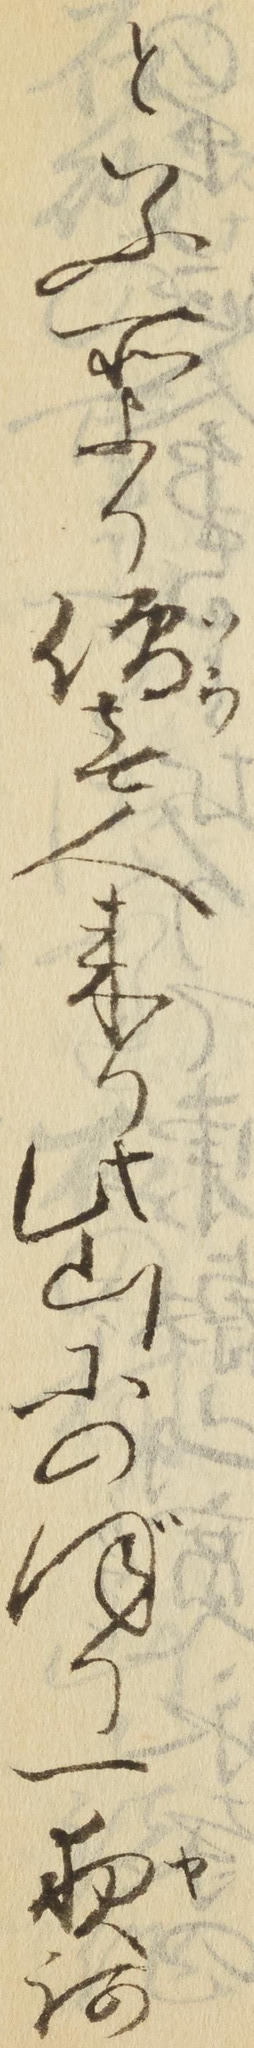といふ所より僧壱人来り此山にのぼり一夜あ
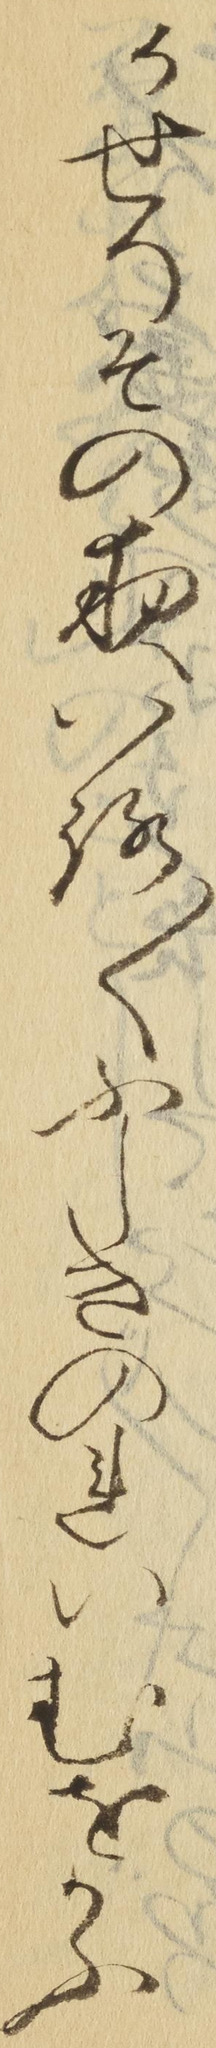かせりその夜いろ〳〵ふしぎのれいむをけふ

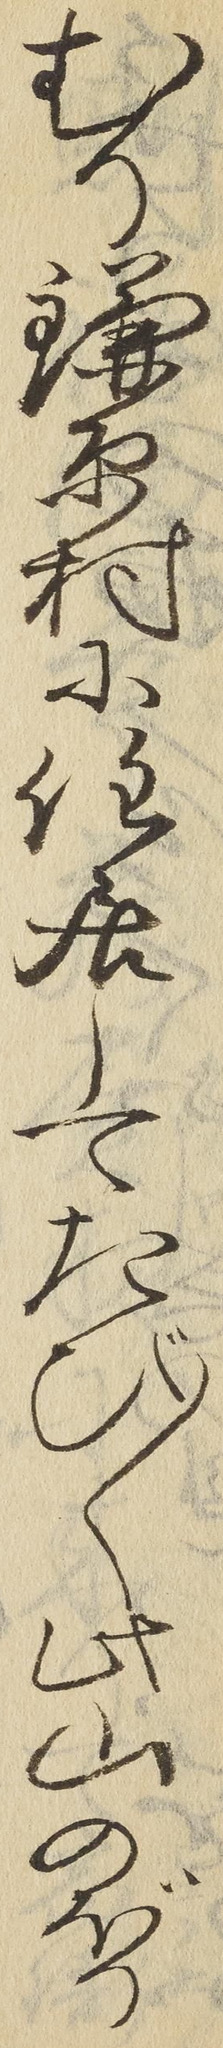むり鎌原村に住居してたび〳〵此山のぼり
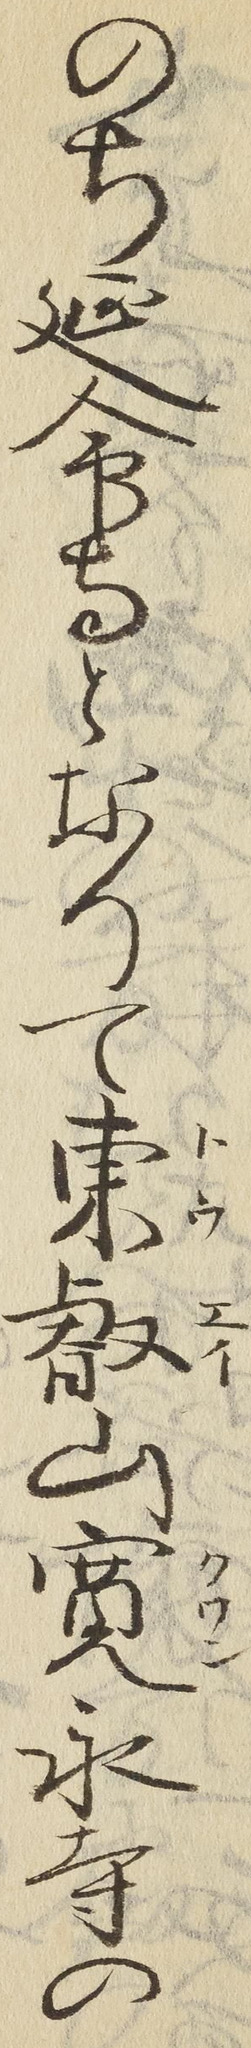のち延命寺となりて東叡山寛永寺の
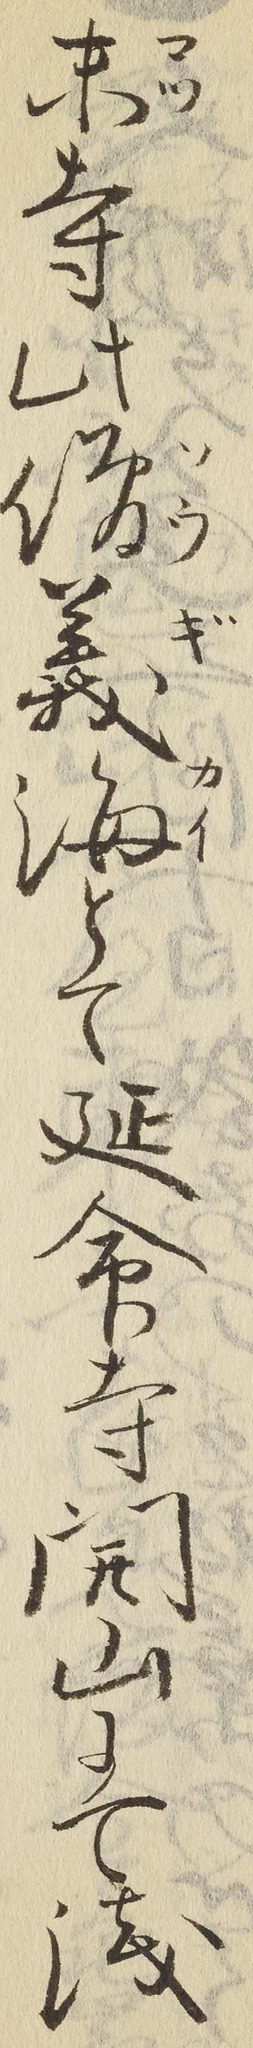末寺此僧義海とて延命寺開山にて浅
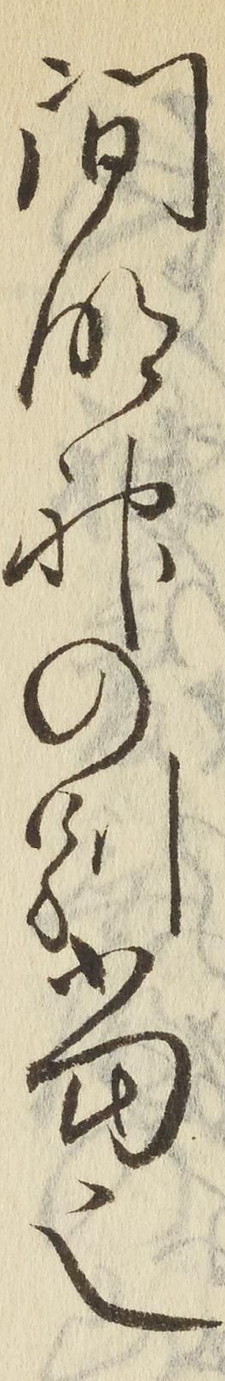間明神の別当也
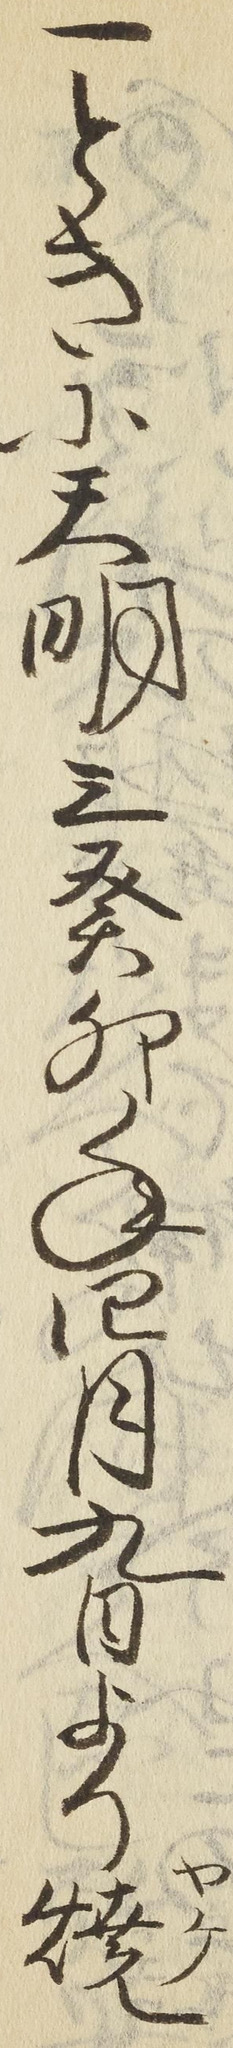一ときに天明三癸卯年四月九日より焼
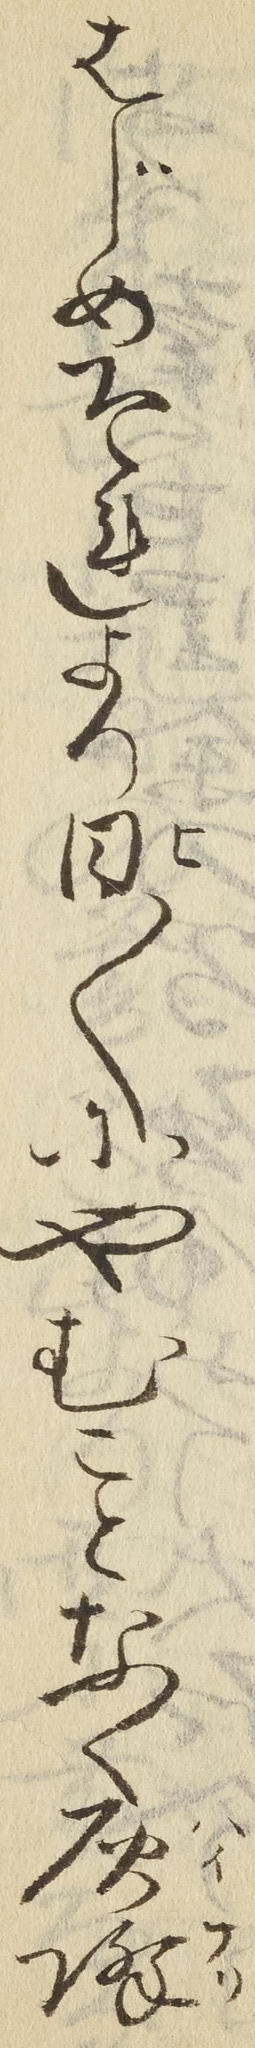はじめこれより日〳〵にやむことなく灰降
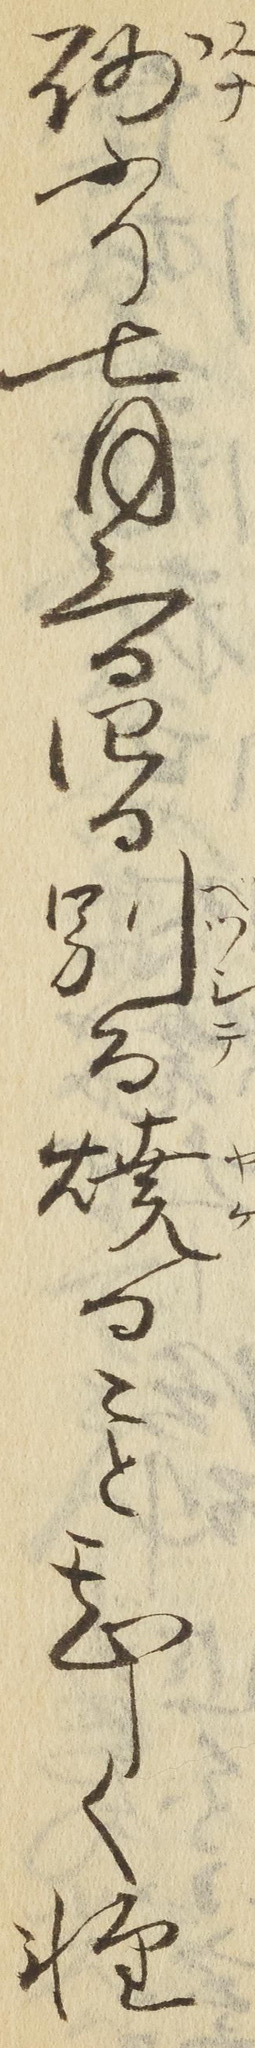砂ふり七月三日四日別而焼ること甚しく軽
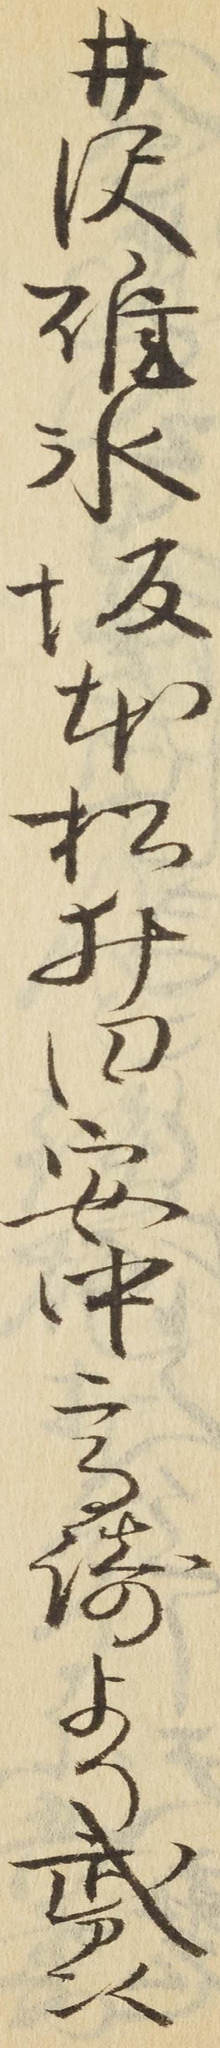井沢碓氷坂本松井田安中高崎より武州
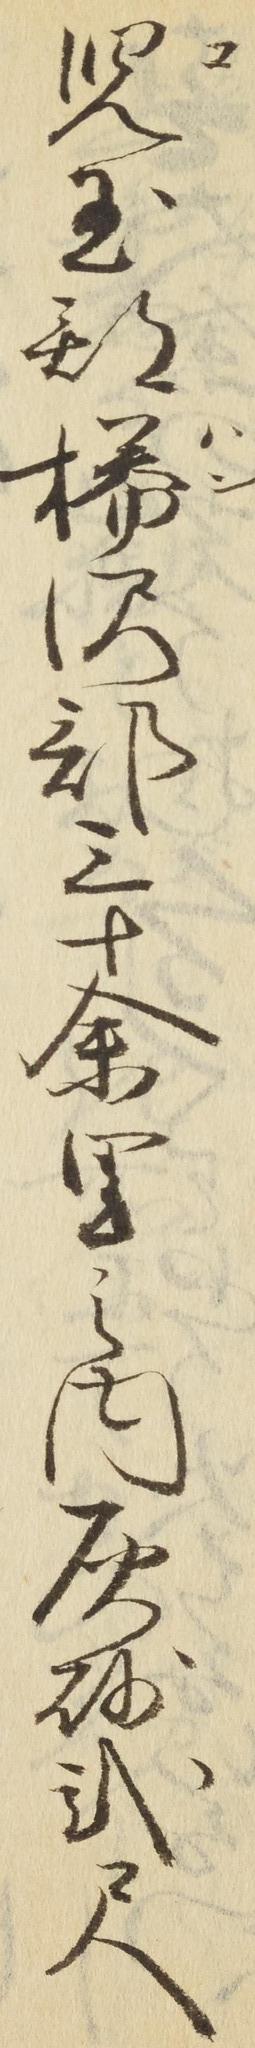児玉郡榛沢郡三十余里之内灰砂弐尺
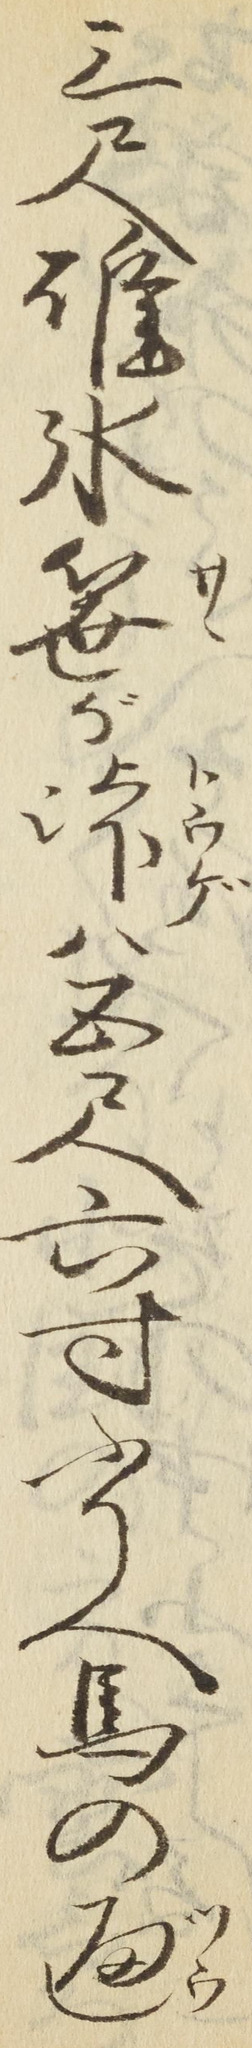三尺碓氷笹が峠は五尺六寸ふり人馬の通
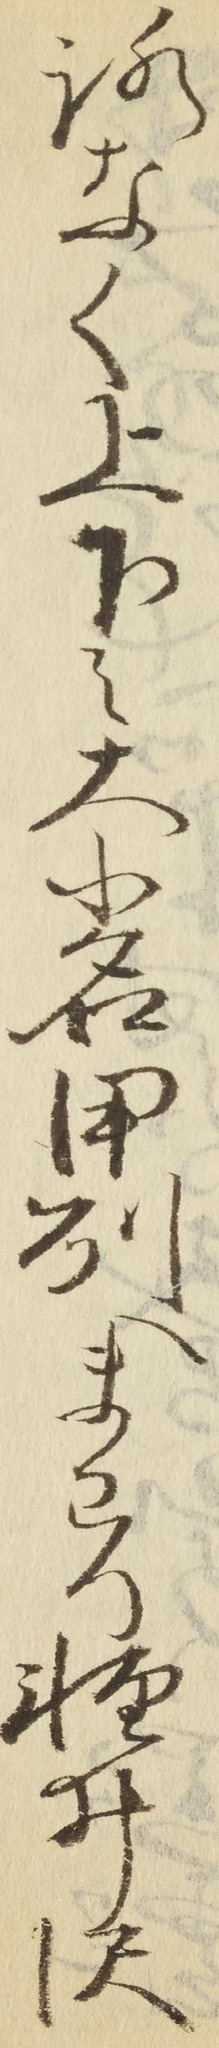路なく上下之大小名っ甲州へまわり軽井沢
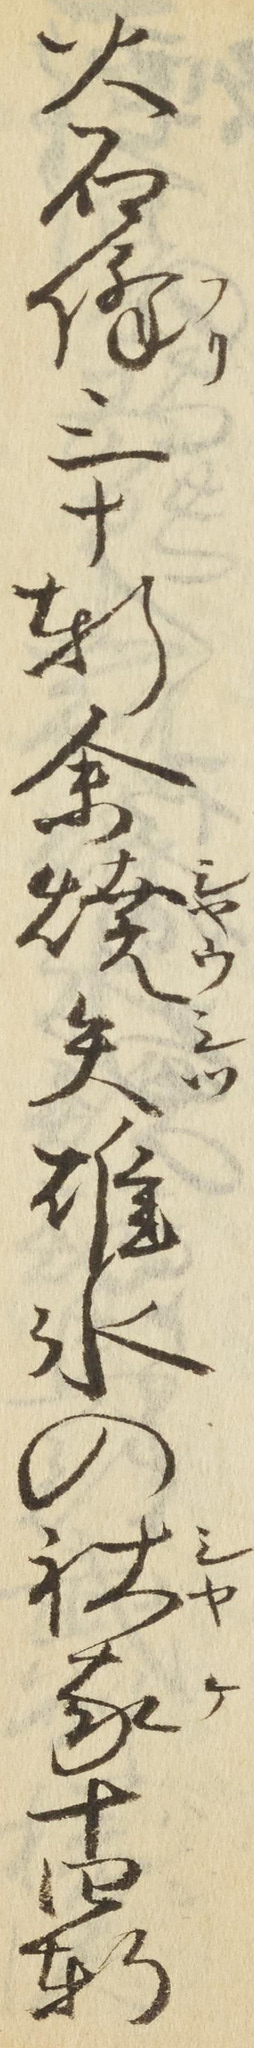火石降三十軒余焼失碓氷の社家十四軒
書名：浅間大變記
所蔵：東京大学地震研究所図書室 Earthquake Research Institute Library, The University of Tokyo, JAPAN
